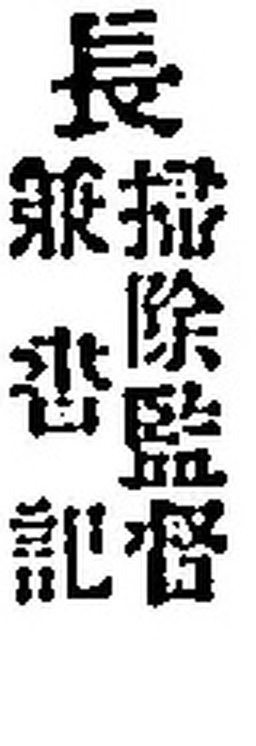兼書記
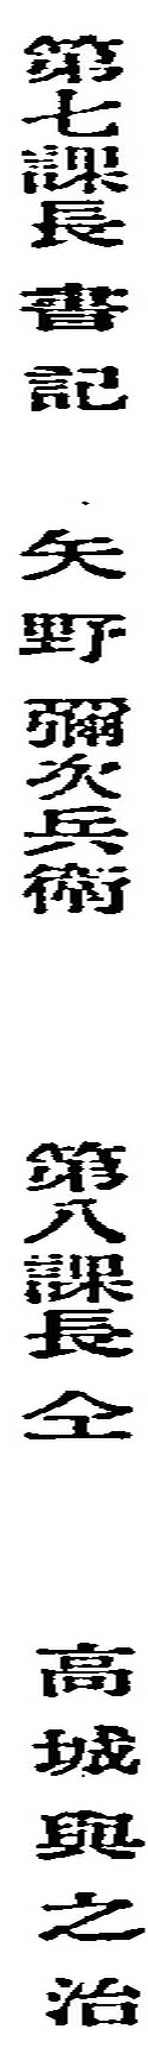第七課長矢野彌次兵衛第八課長仝高城與之治
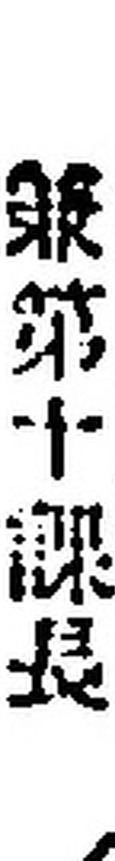兼第一課長
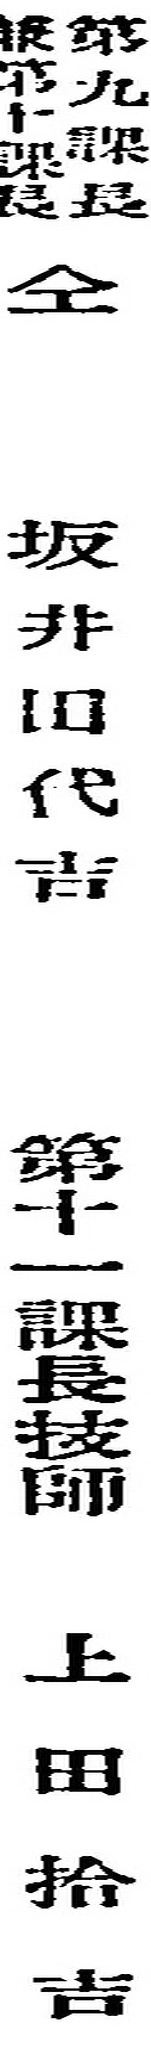第九課長仝境田代吉第十一課長技師上田拾吉
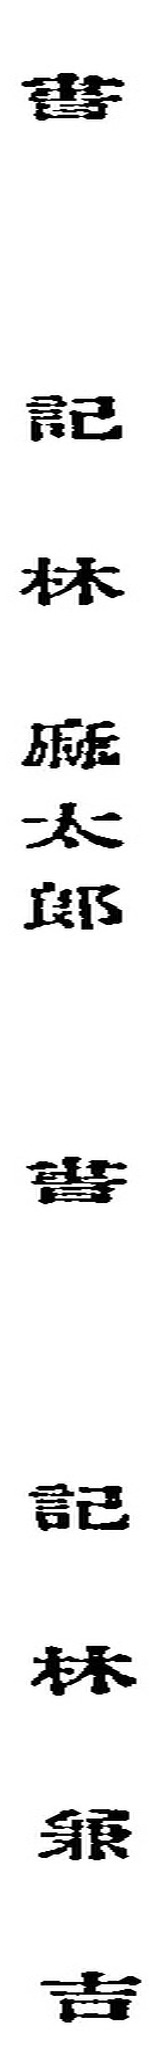書記林麻太郞書記林兼吉
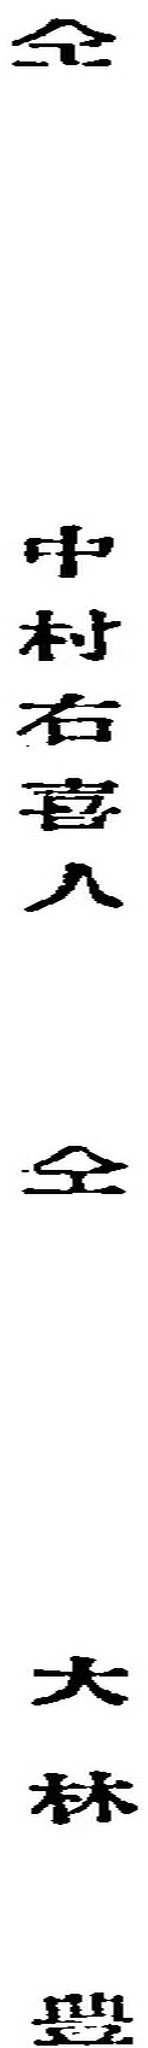仝中村右喜人仝大林豊
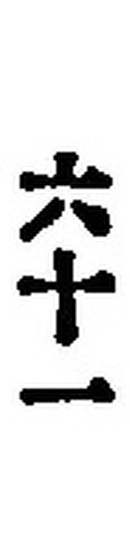六十一

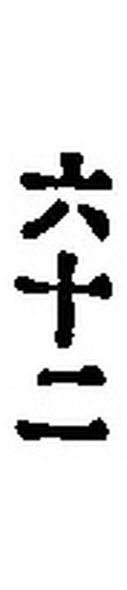六十二
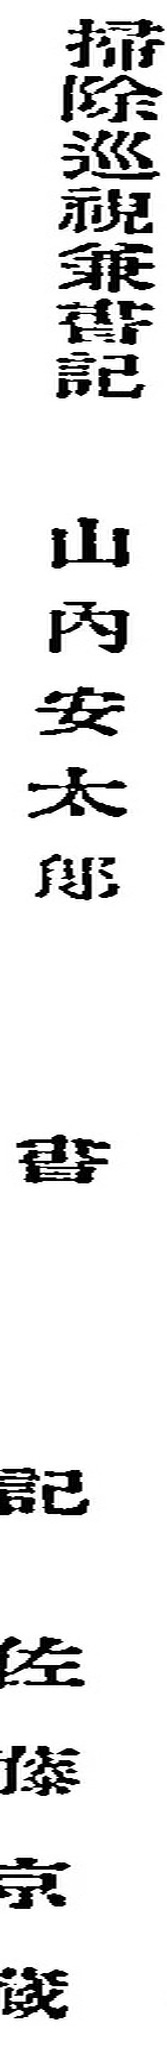掃除巡視兼書記山内安太郞書記佐藤京藏
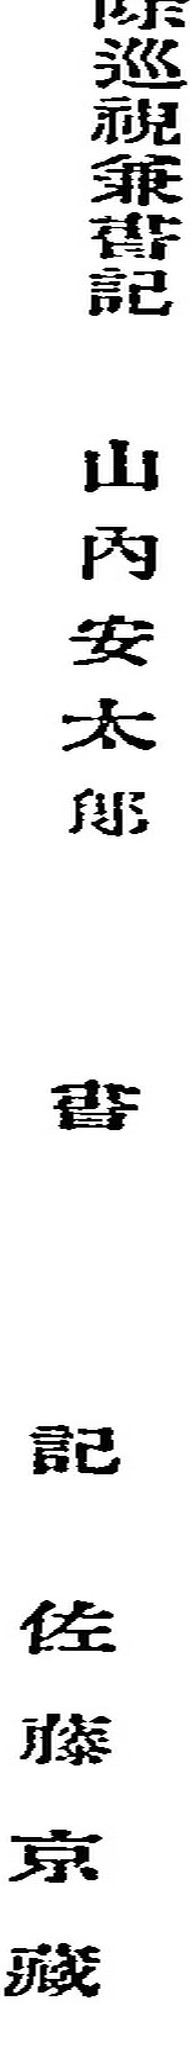掃除巡視兼書記山内安太郞書記佐藤京藏
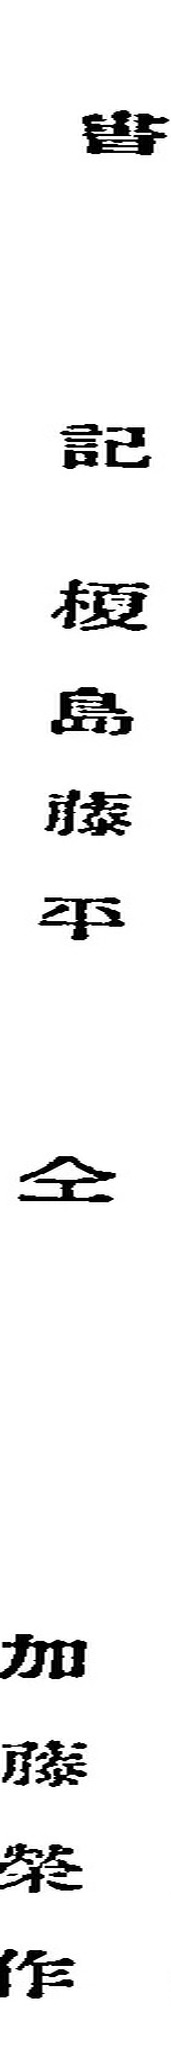書記榎島藤平仝加藤榮作
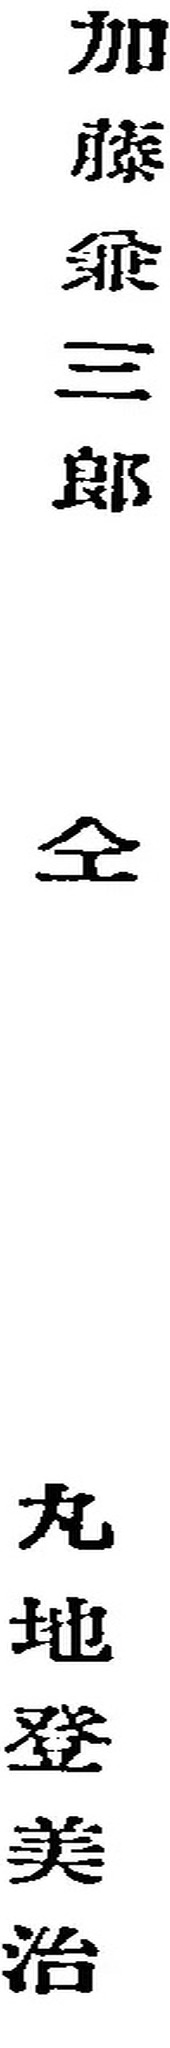仝加藤兼三郞仝丸地登美治
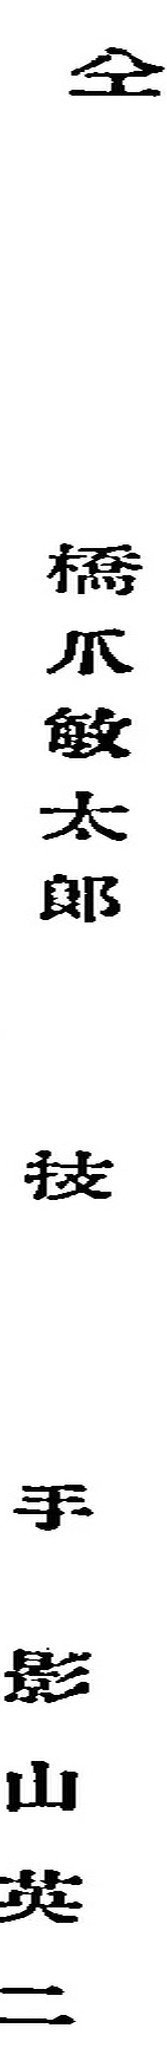仝橋爪敏太郞技手影山英二
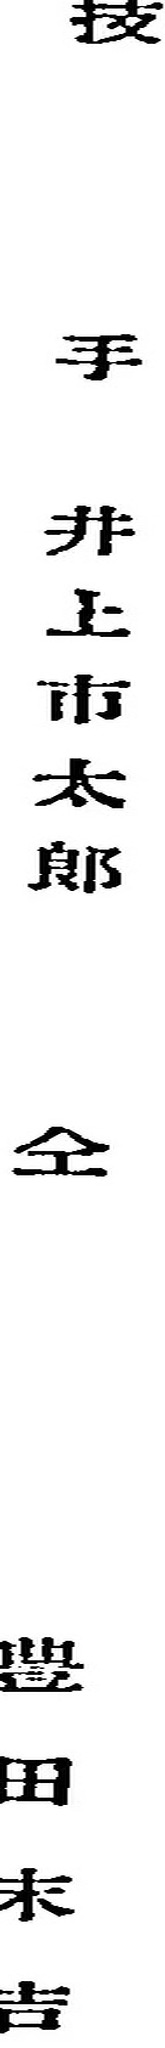技手井上市太郞仝豊田末吉
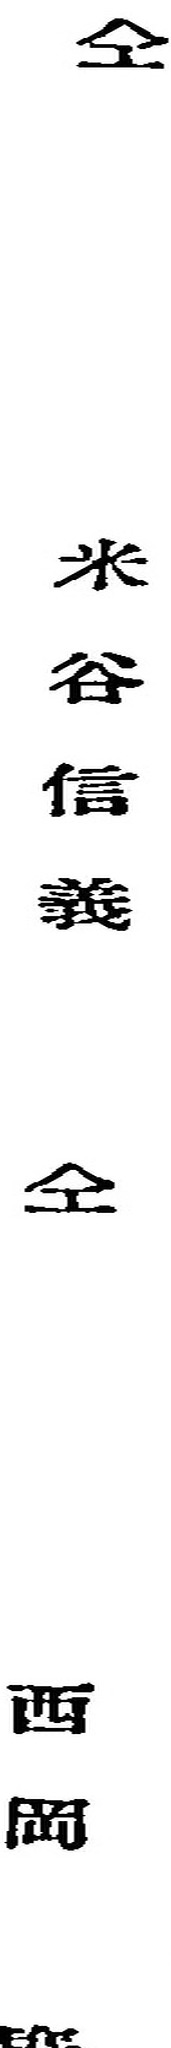仝米谷信義仝西岡廣
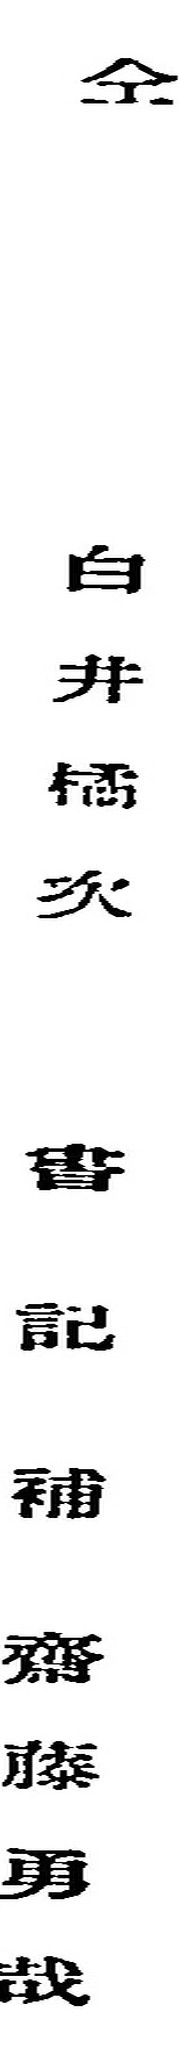仝白井橘次書記補齋藤勇哉
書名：豊橋志要
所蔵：国立国会図書館 National Diet Library, JAPAN
